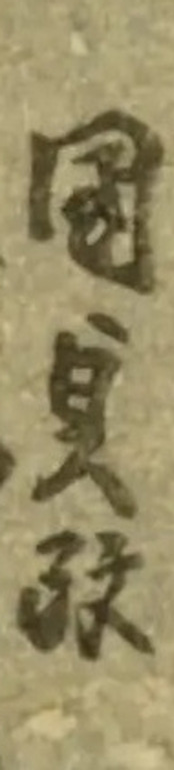国貞改
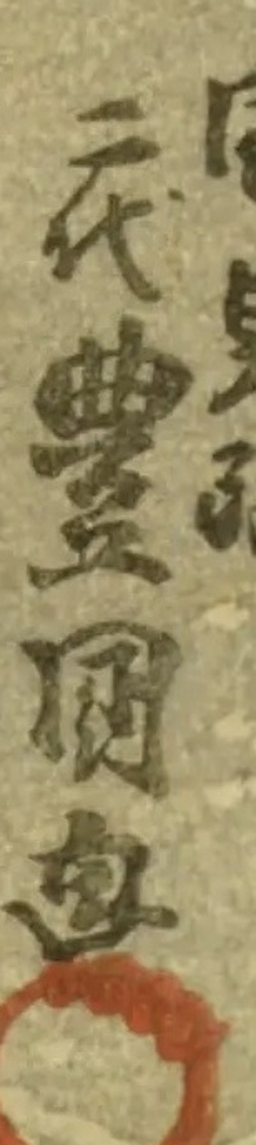二代豊国画
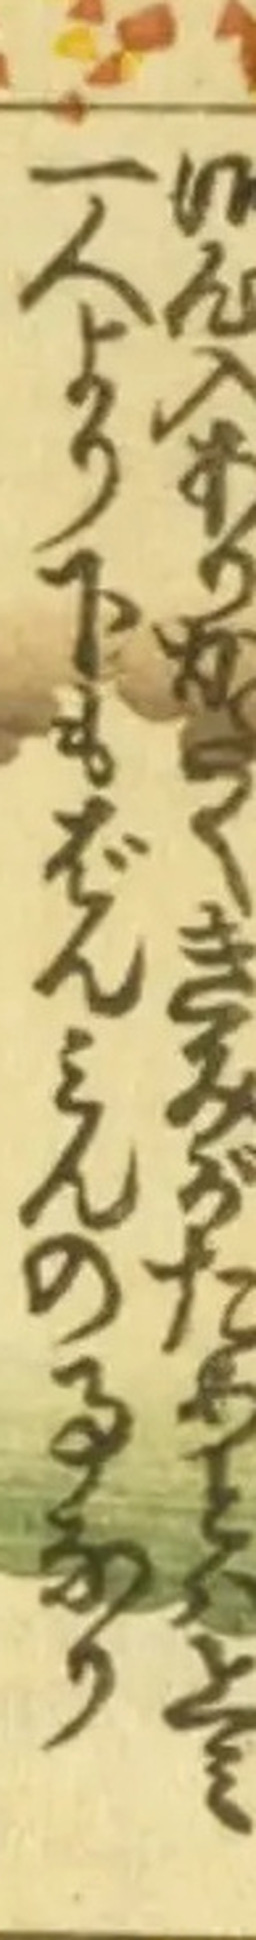一人より下もばんみんの事なり
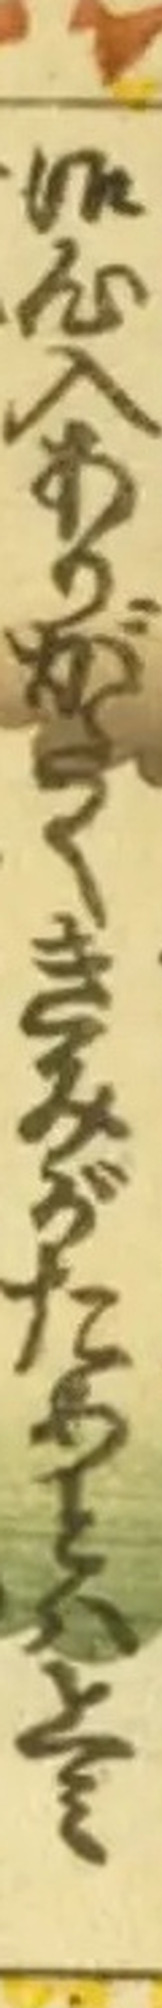御心入ありがたくきみがためとは上み
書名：百人一首絵抄　十五　光孝天皇
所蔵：国立国会図書館 National Diet Library, JAPAN
